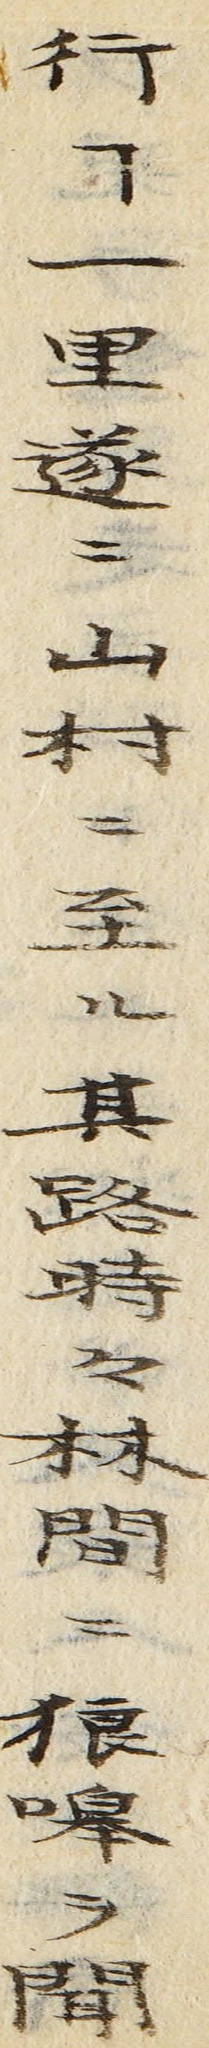行コト一里遂ニ山村ニ至ル其路時々林間ニ狼嗥ヲ聞
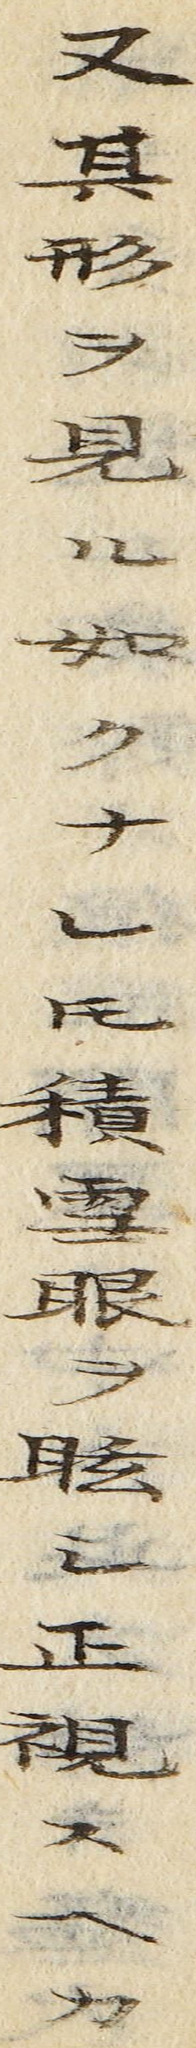又其形ヲ見ル如クナレトモ積雪眼ヲ眩シ正視スヘカ
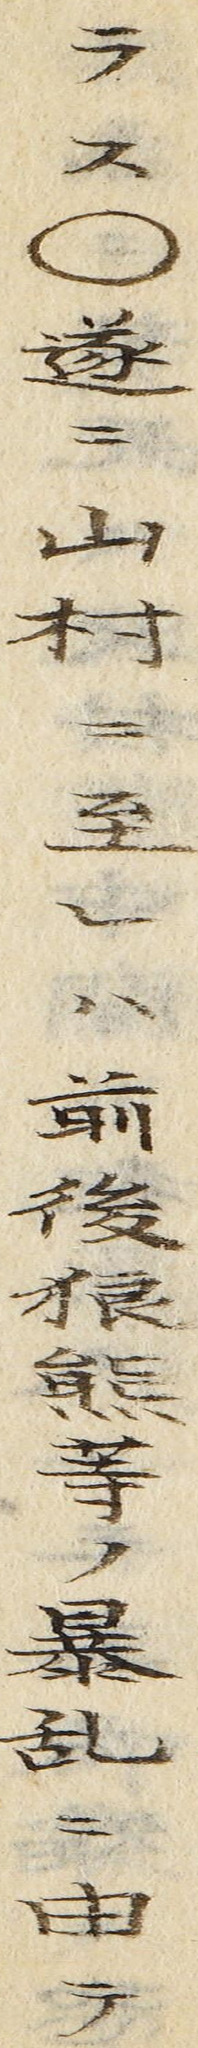ラス◯遂ニ山村ニ至レハ前後狼熊等ノ暴乱ニ由テ
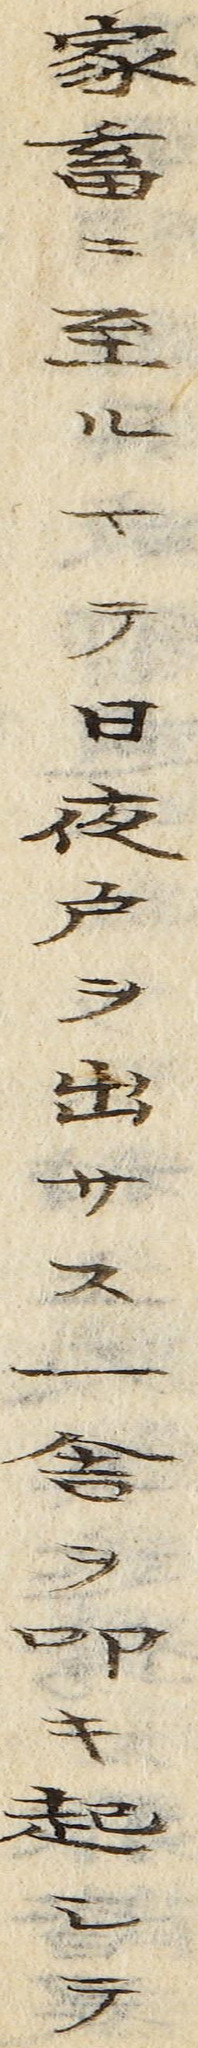家畜ニ至ルマテ日夜戸ヲ出サス一舎ヲ叩キ起シテ
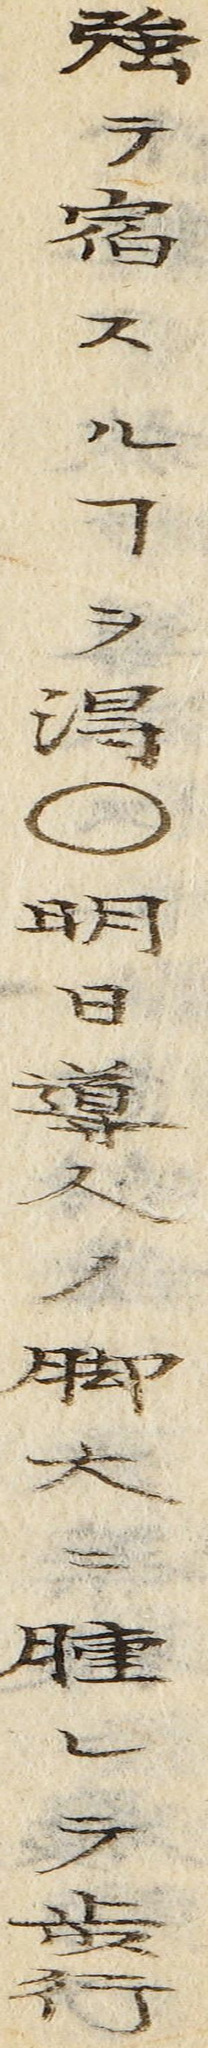強テ宿スルコトヲ得◯明日導人ノ脚大ニ腫レテ歩行
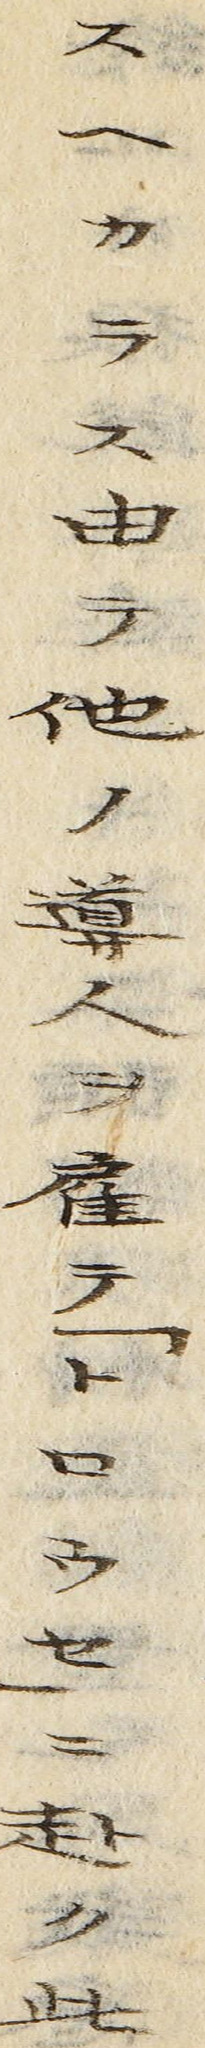スヘカラス由テ他ノ導人ヲ雇テ「トロウセ」ニ赴ク此
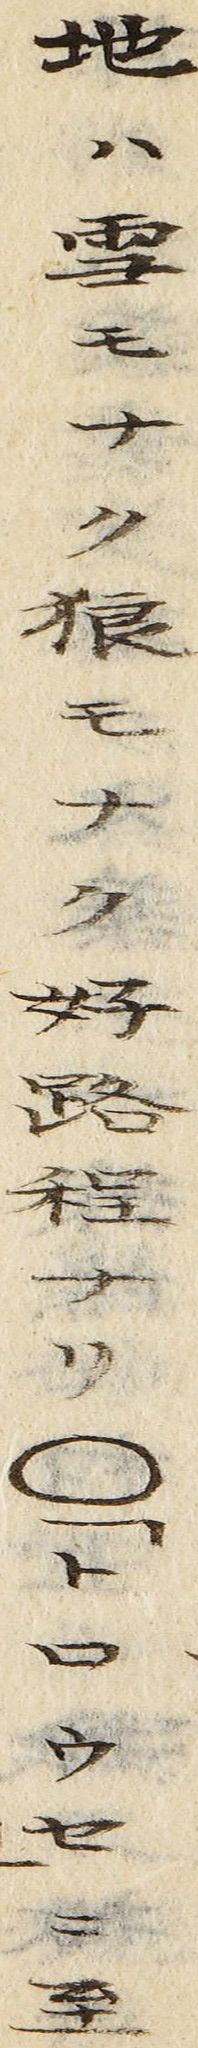地ハ雪モナク狼モナク好路程ナリ◯「トロウセ」ニ至
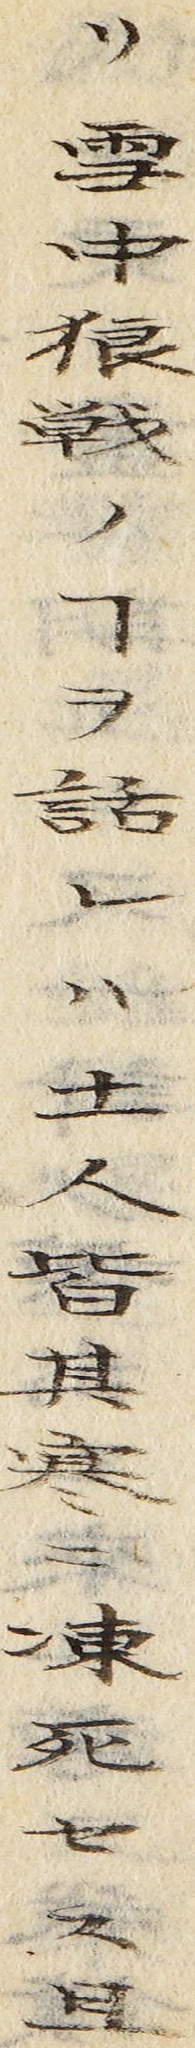リ雪中狼戦ノコトヲ話レハ土人皆其寒ニ凍死セス且
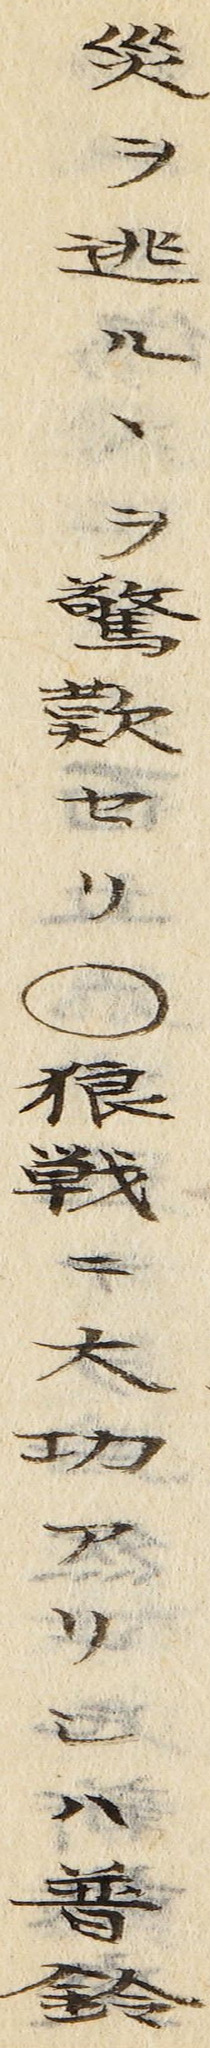災ヲ逃ルヽヲ驚歎セリ◯狼戦ニ大功アリシハ普鈴
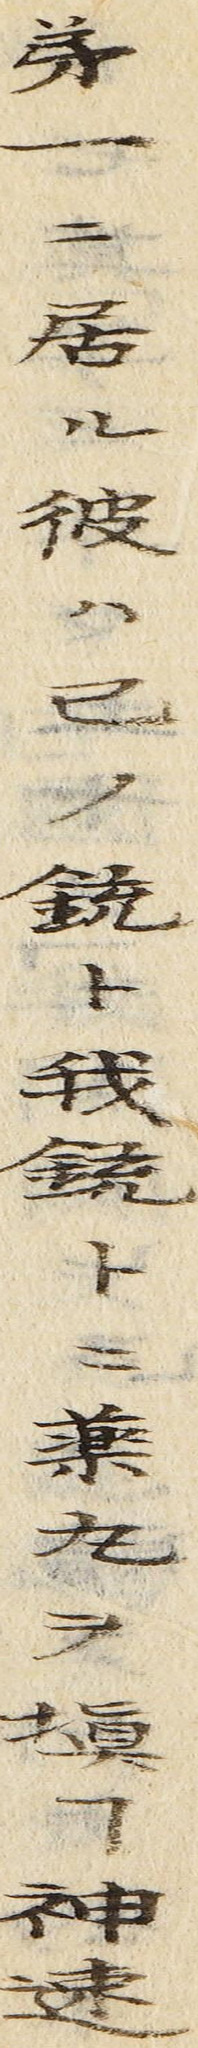第一ニ居ル彼ハ己ノ銃ト我銃トニ薬丸ヲ填コト神速
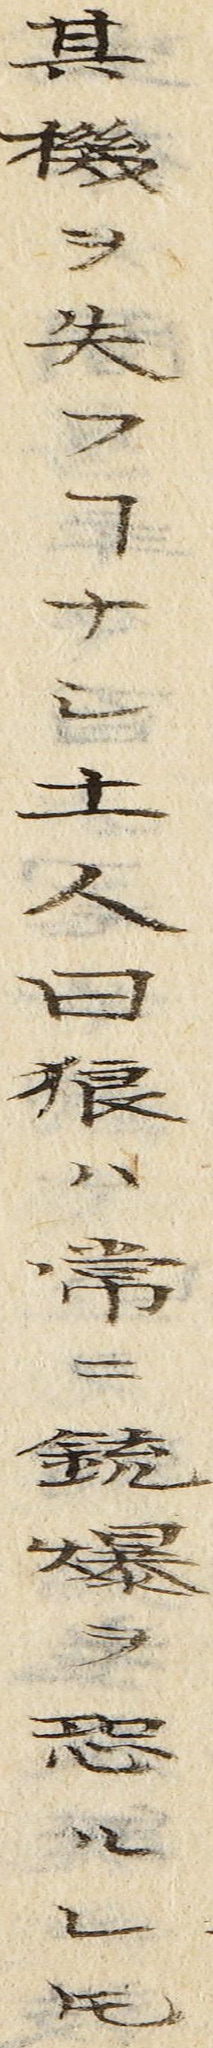其機ヲ失フコトナシ土人曰狼ハ常ニ銃爆ヲ恐ルレトモ
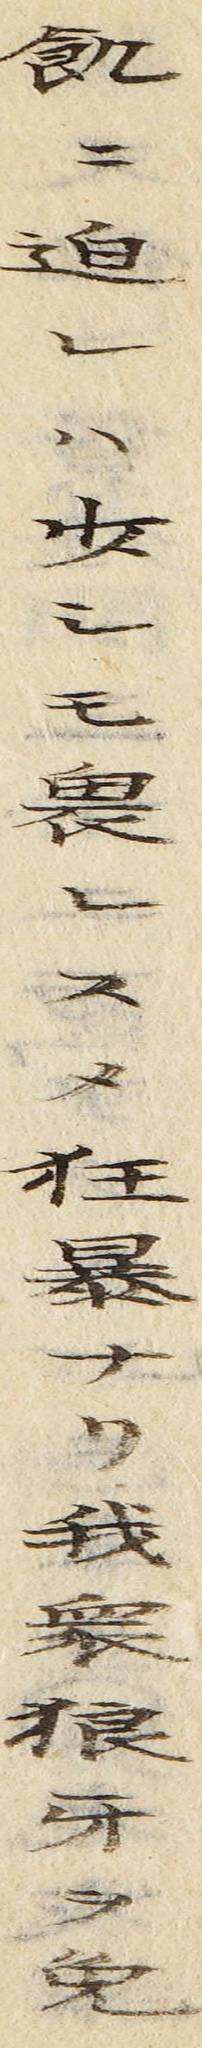飢ニ迫レハ少シモ畏レスシテ狂暴ナリ我衆狼牙ヲ免
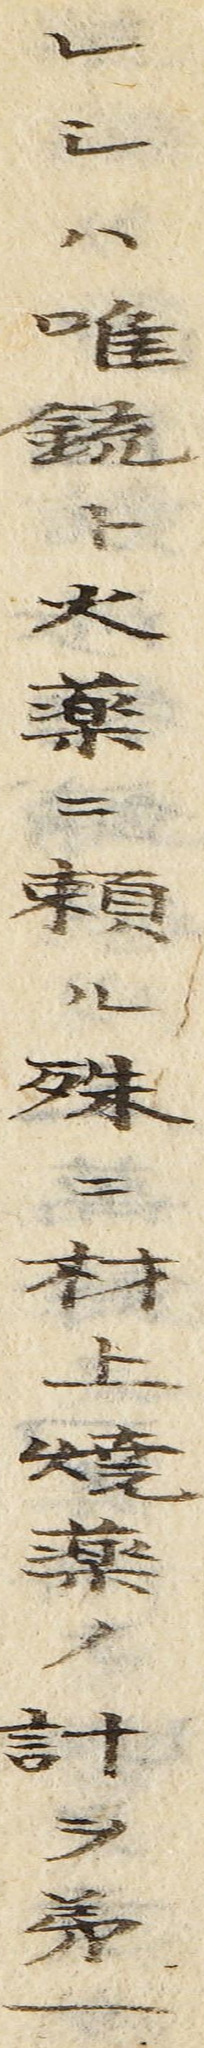レシハ唯銃ト火薬ニ頼ル殊ニ材上焼薬ノ計ヲ第一
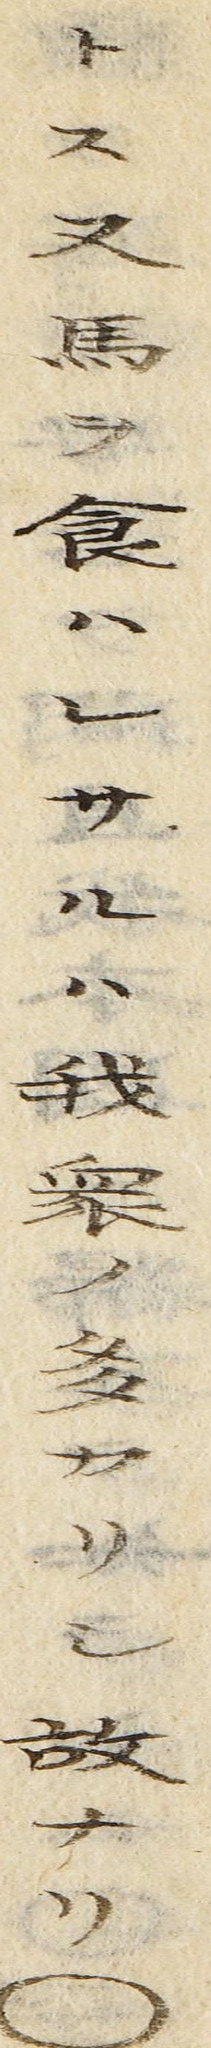トス又馬ヲ食ハレサルハ我衆ノ多カリシ故ナリ◯
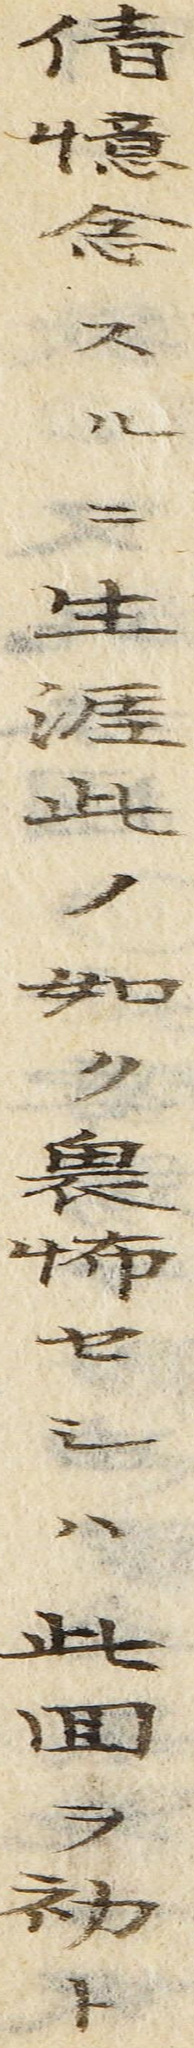倩憶念スルニ生涯此ノ如ク畏怖セシハ此回ヲ初ト
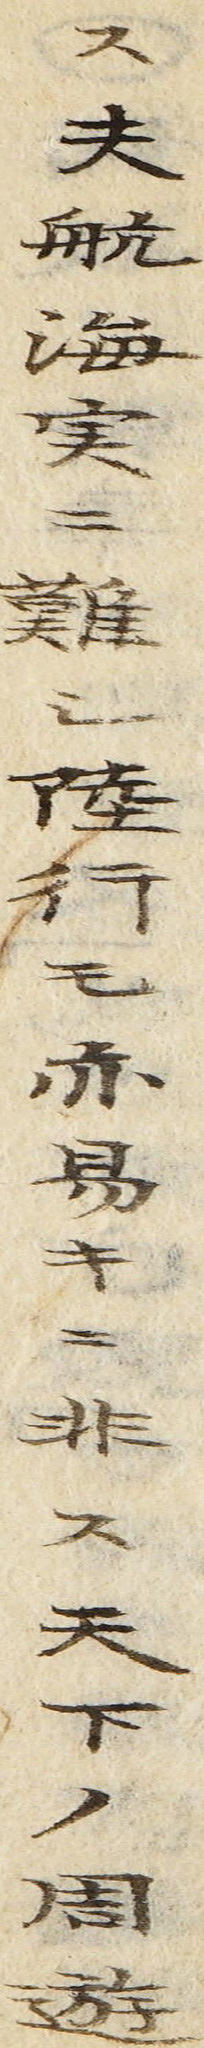ス夫航海実ニ難シ陸行モ亦易キニ非ス天下ノ周遊
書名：漂流紀事
